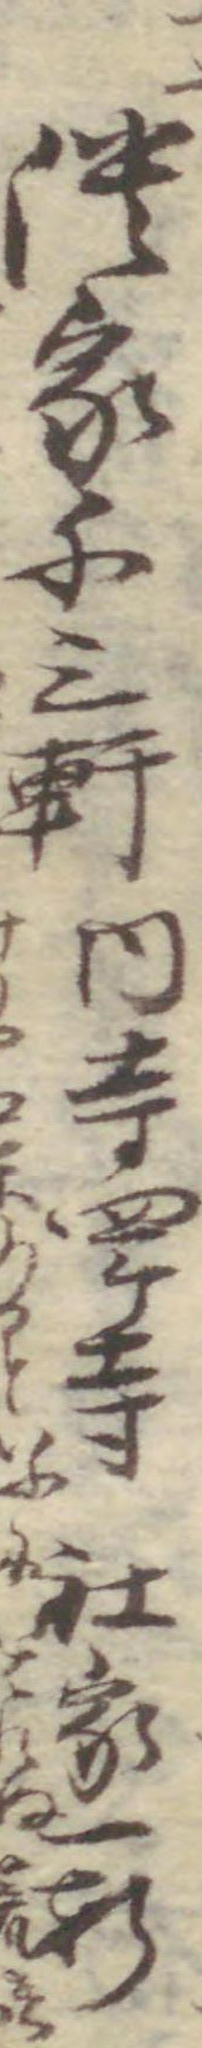一潰家千三軒内寺四ケ寺社家一軒
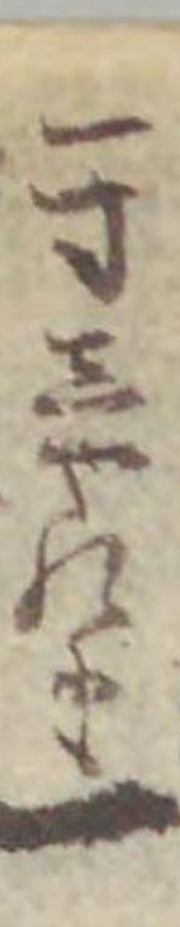一寸しやれにも
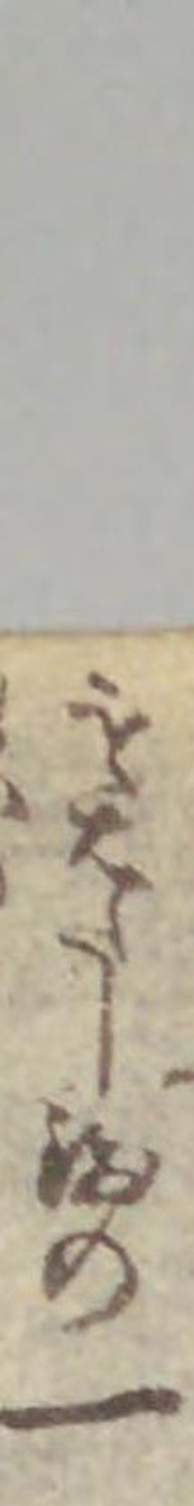もはたし銭の
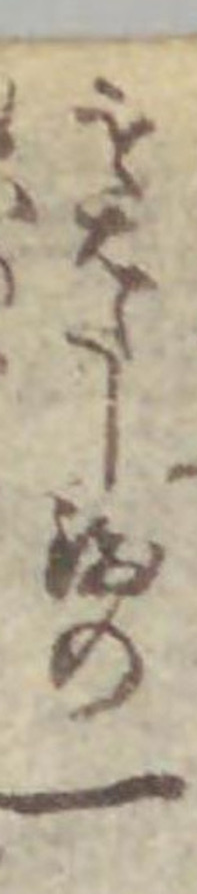もはたし銭の
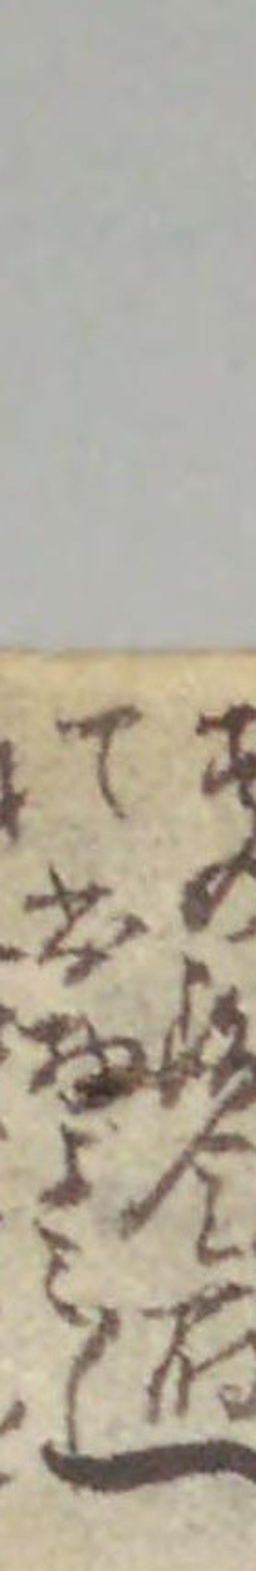て書物よミ〳〵
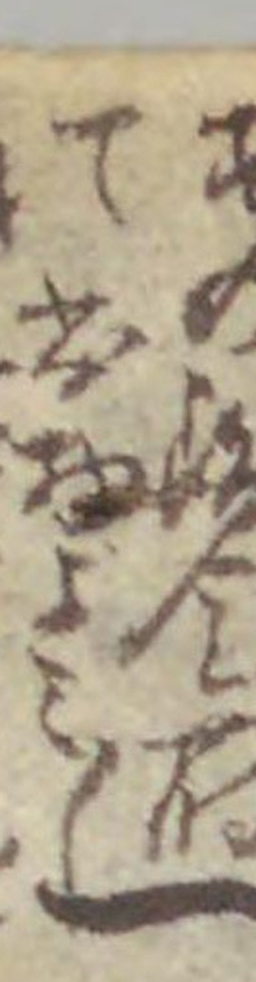て書物よミ〳〵
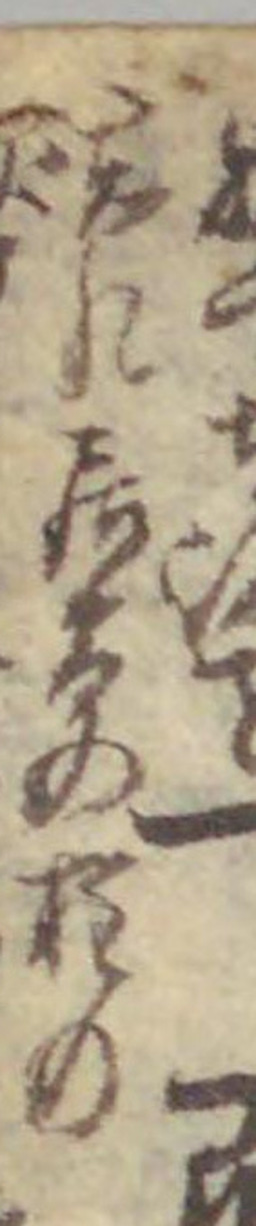わすれ居間の柱の
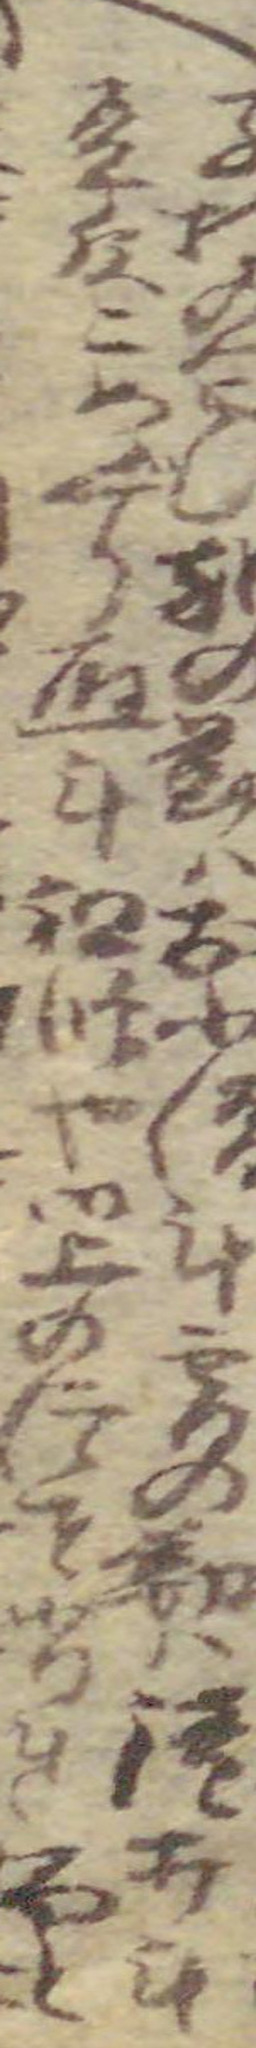昼夜こめぐり慰斗祖師や御上の信を背き酒と

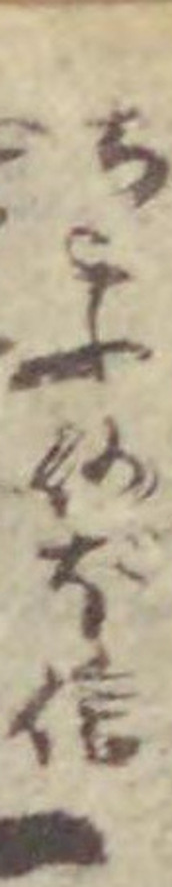ちこう何ぼ信
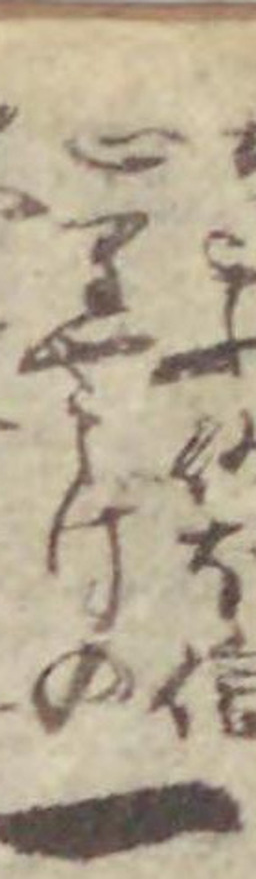心りやうげの
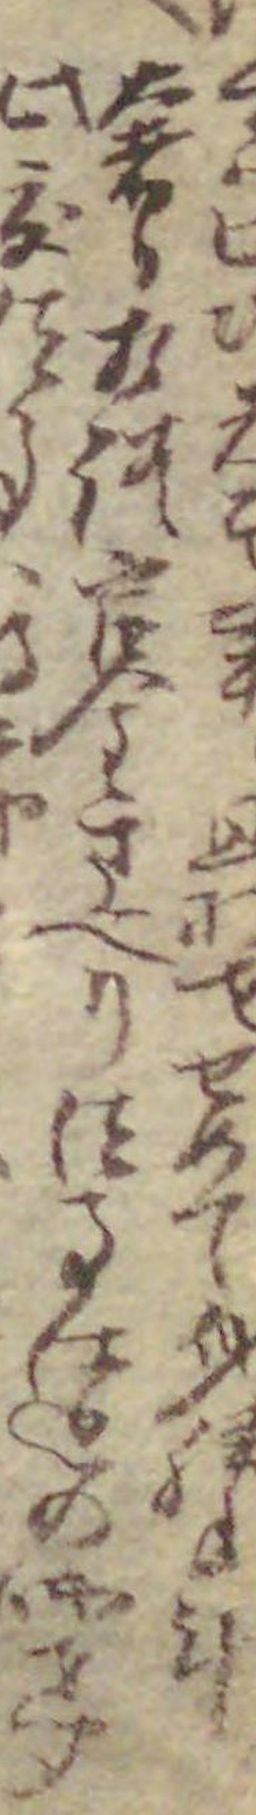奢り相談官金さべり法事仕廻の咄を聞ハ
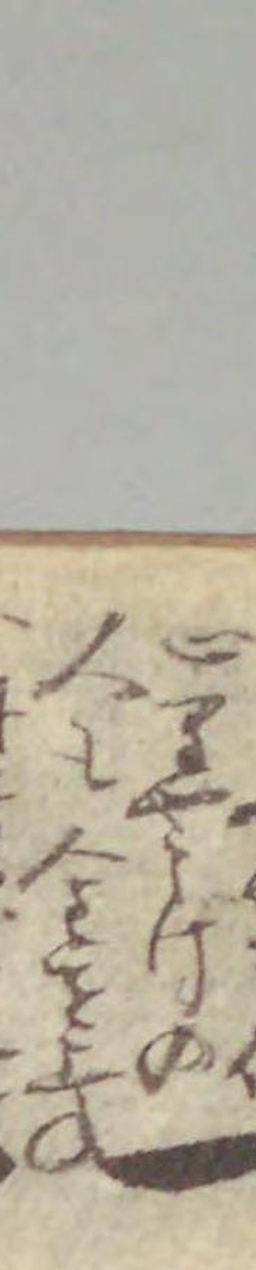人も金を上ね
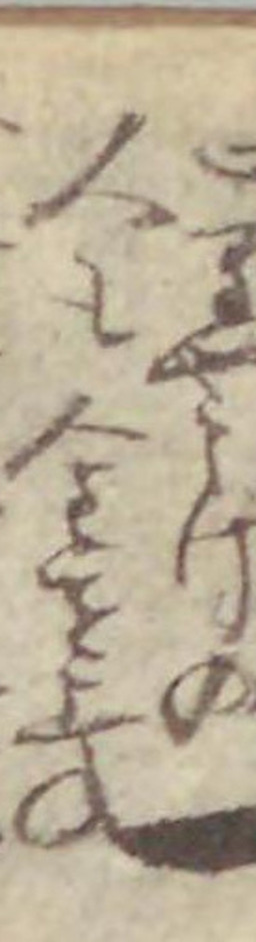人も金を上ね
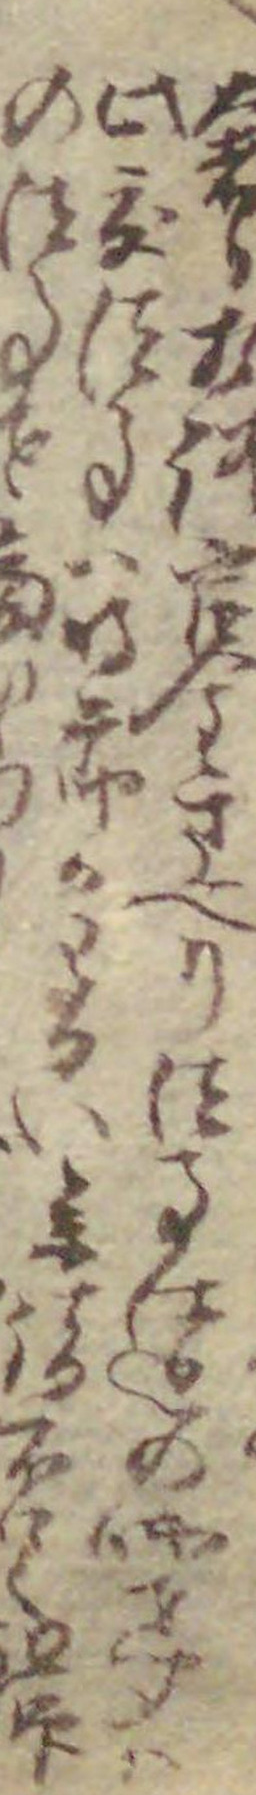此度法事ハ時節かわるい参詣不足祖師
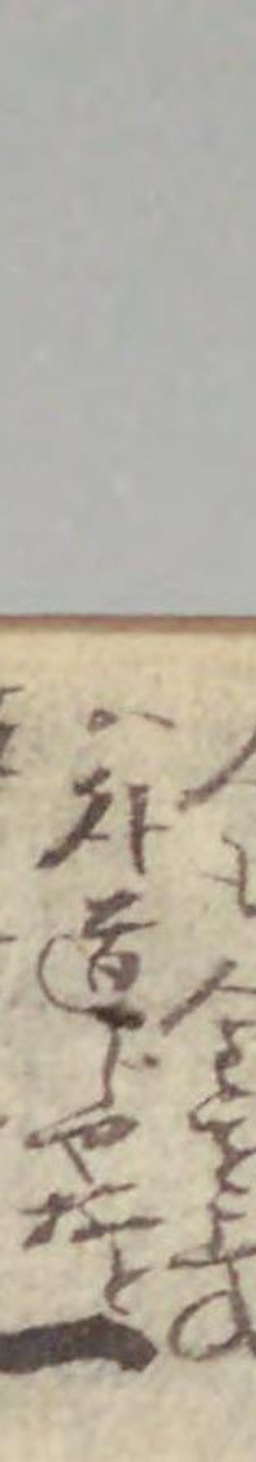ハ外道じや抔と
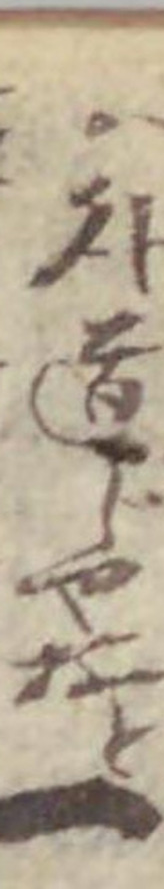ハ外道じや抔と
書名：鶯宿雑記. 巻199-200
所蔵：国立国会図書館 National Diet Library, JAPAN
